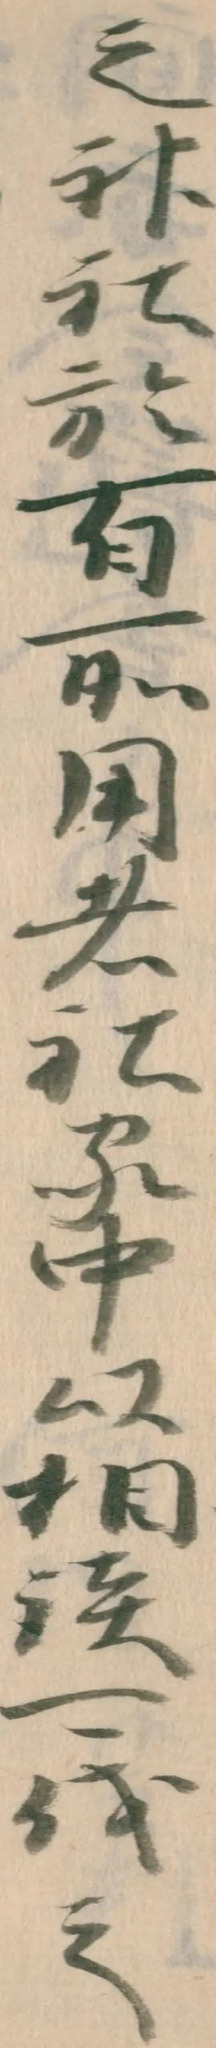之神社於有所用は社家中以相談可伐之
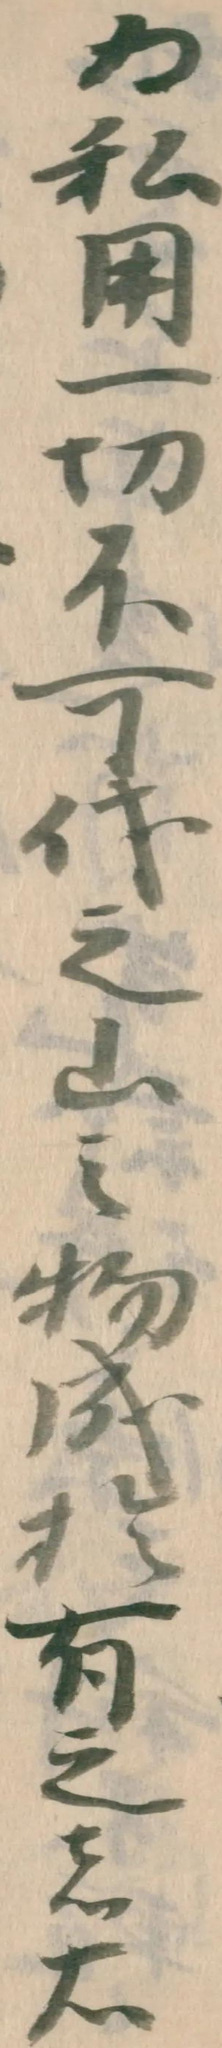為私用一切不可伐之山之物成於有之は右
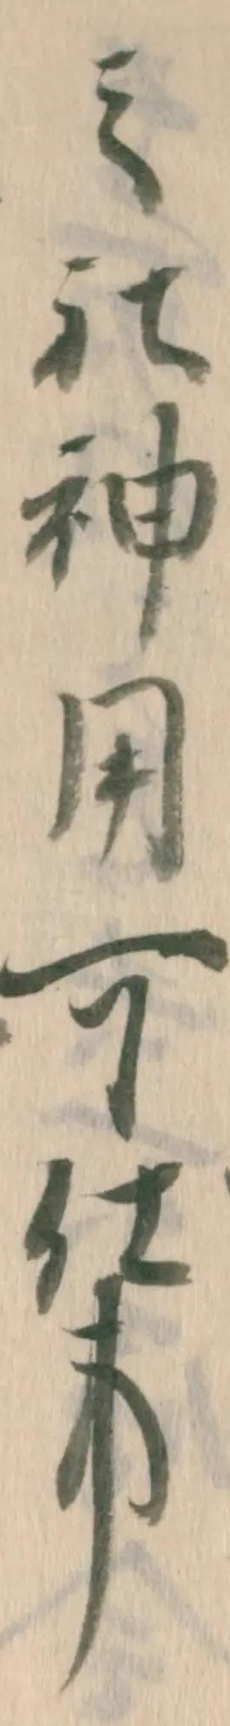之社神用可仕事
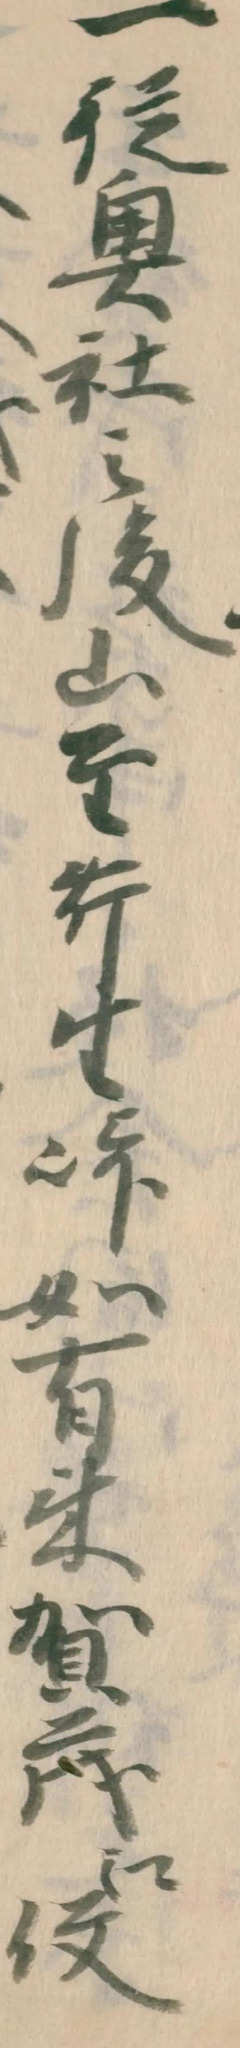一従奥社之後山至芹生峠如有来賀茂え役
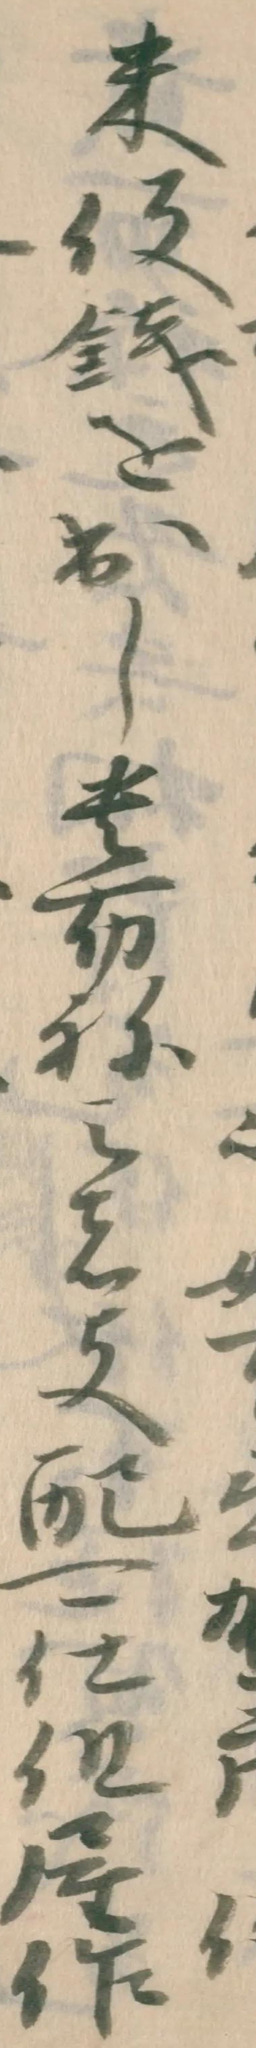米役銭を出し貴ふね之者支配可仕但屋作
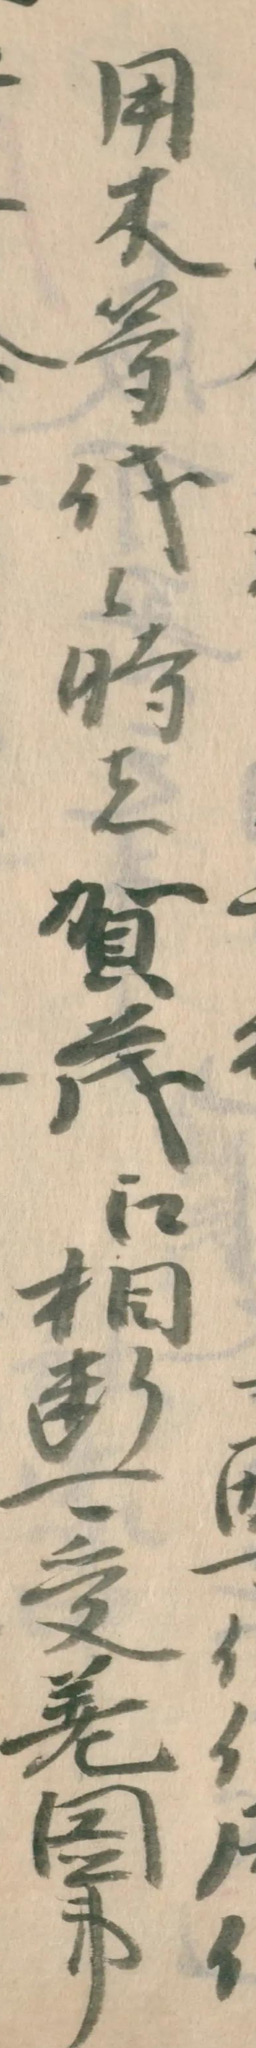用木等伐候時は賀茂え相断可受差図事
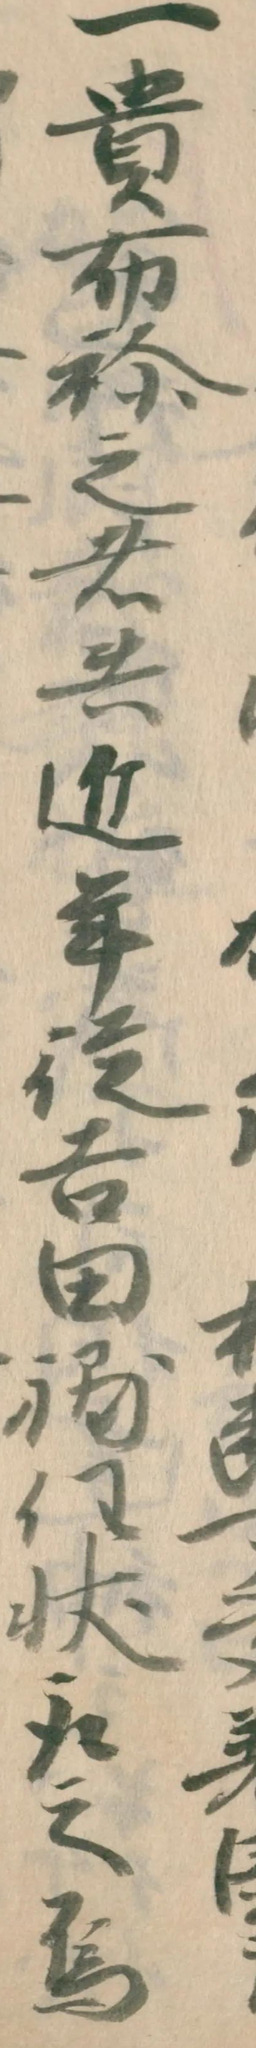一貴ふね之者共近年従吉田補任状取之烏
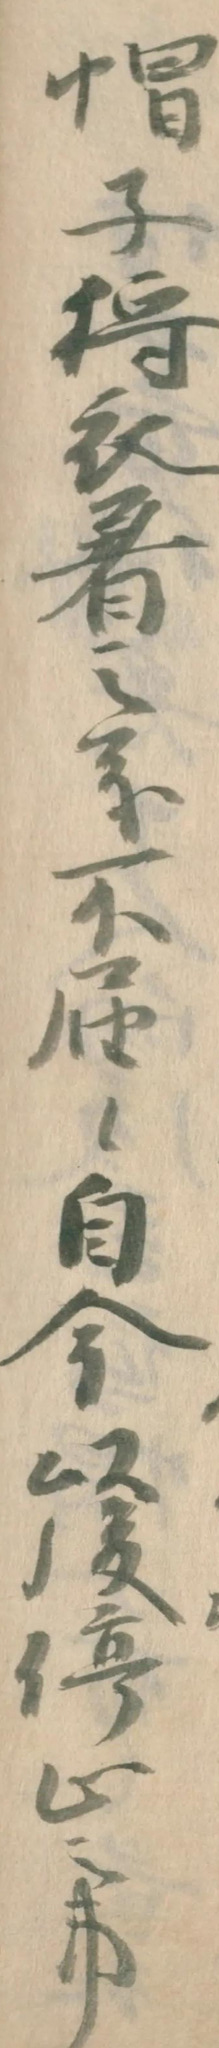帽子狩衣着之義不届候自今以後停止之事

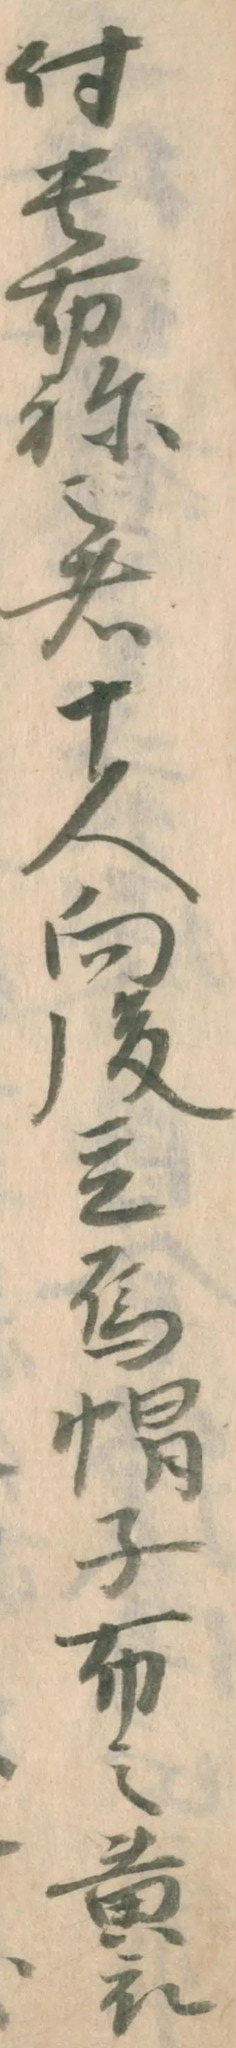付貴ふね之者十人向後立烏帽子布之黄衣
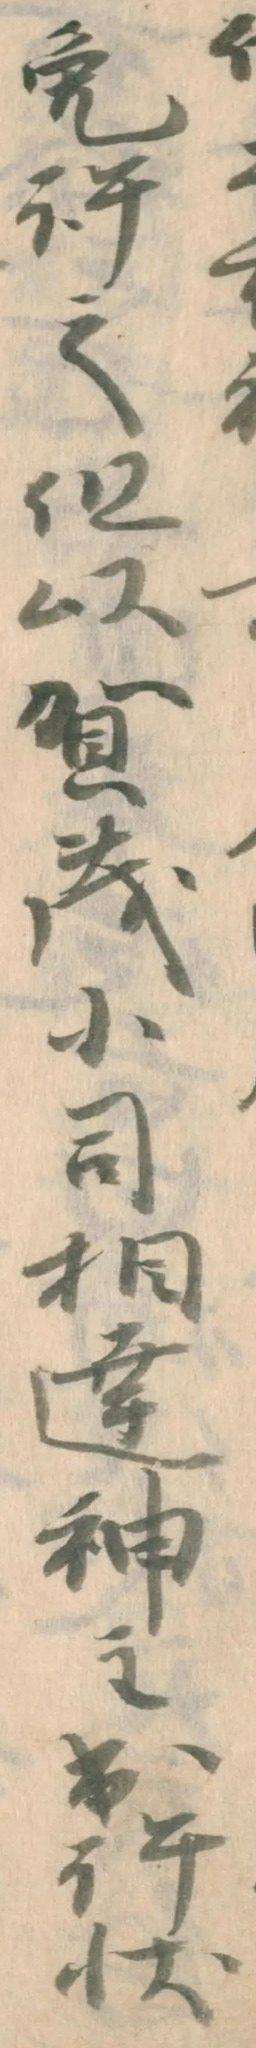免許之但以賀茂小司相達神主出許状
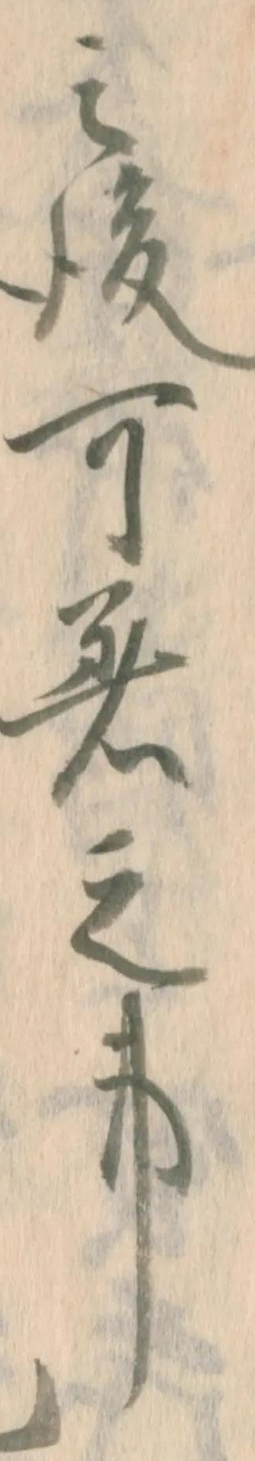之後可着之事
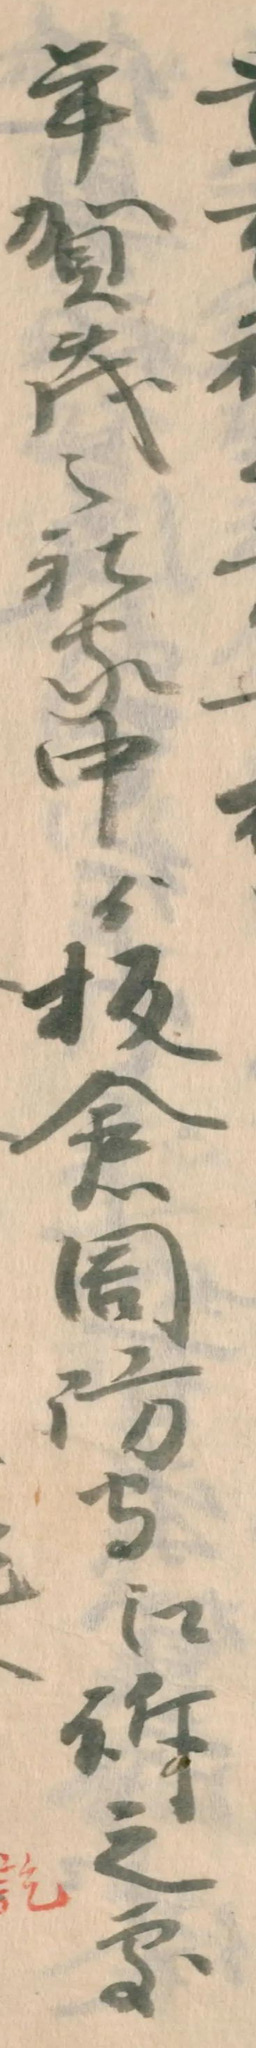年賀茂之社家中ゟ板倉周防守え訴之処
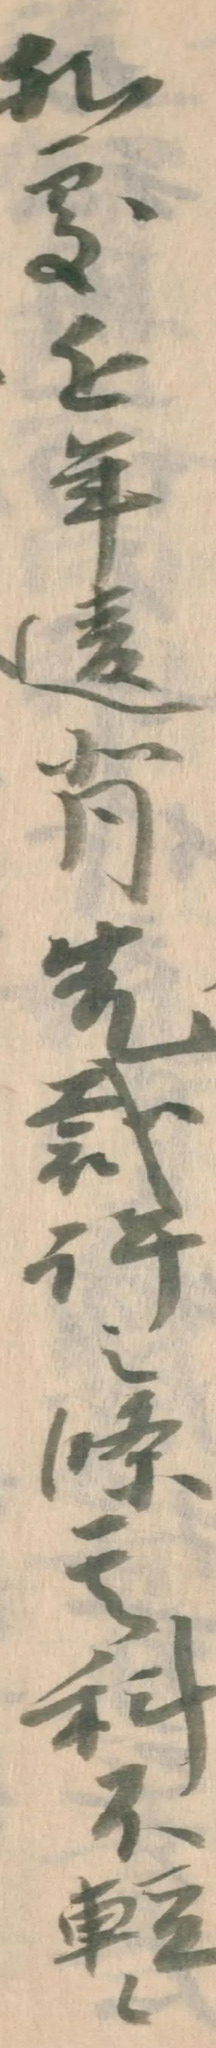然処近年違背先裁許之条其科不軽候
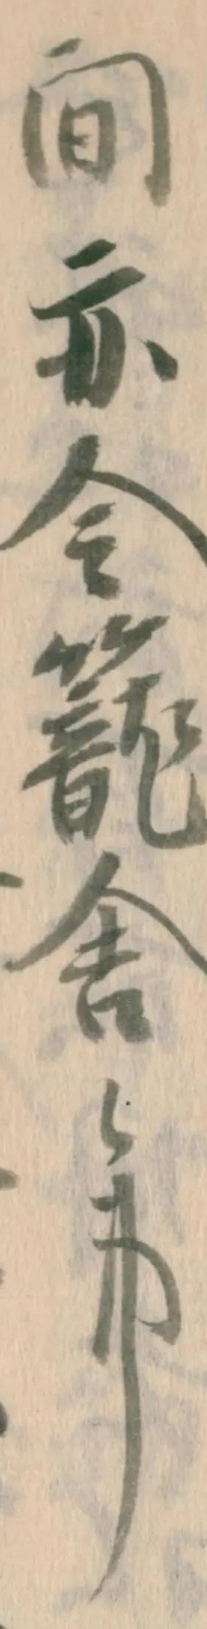間亦令籠舎候事
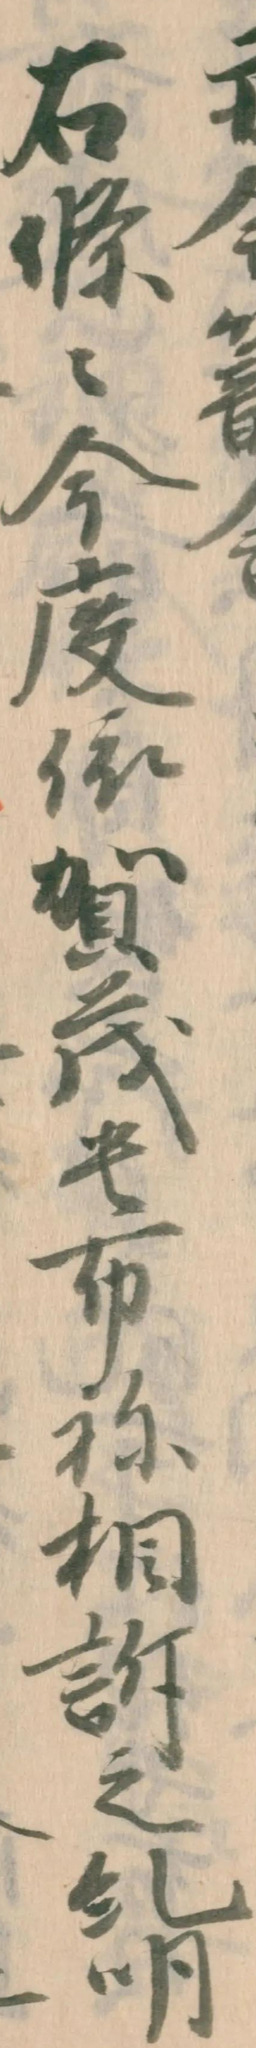右条々今度依賀茂貴ふね相訴之糾明
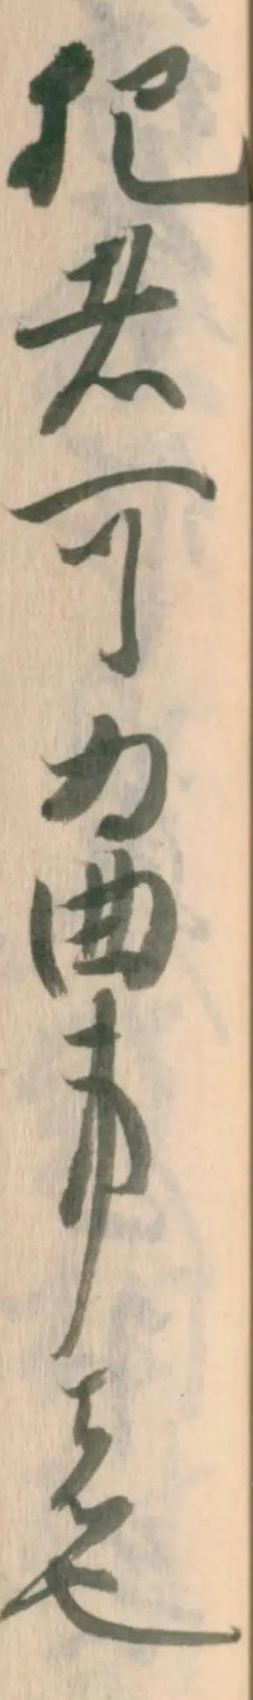犯者可為曲事者也
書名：賀茂社記録. 第1冊
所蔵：国立国会図書館 National Diet Library, JAPAN
